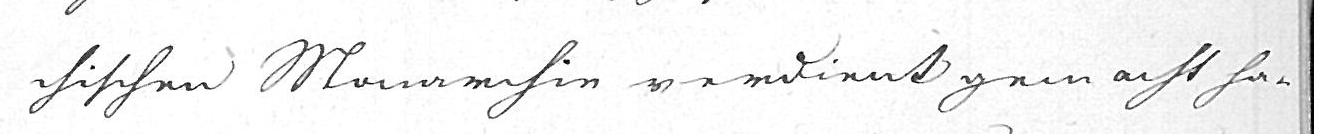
chischen Monarchie verdient gemacht ha-
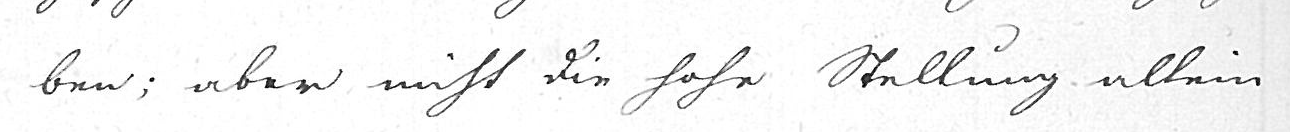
ben, aber nicht die hohe Stellung allein
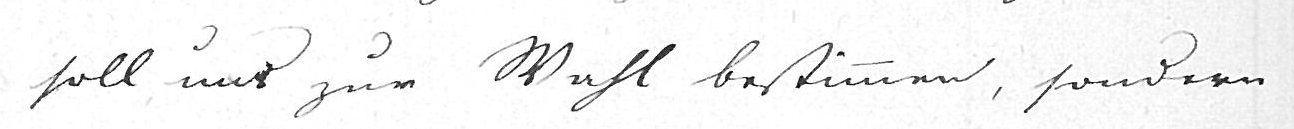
soll uns zur Wahl bestimmen, sondern
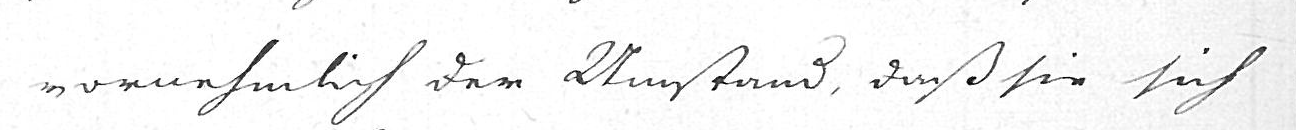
vornehmlich der Umstand, daß sie sich
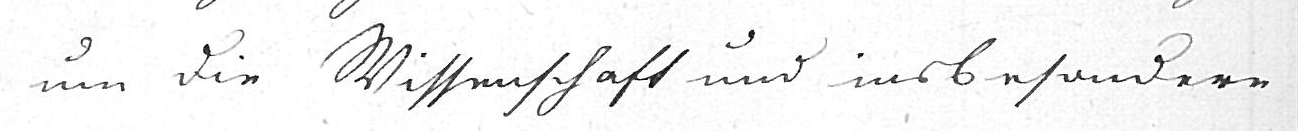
um die Wissenschaft und insbesondere
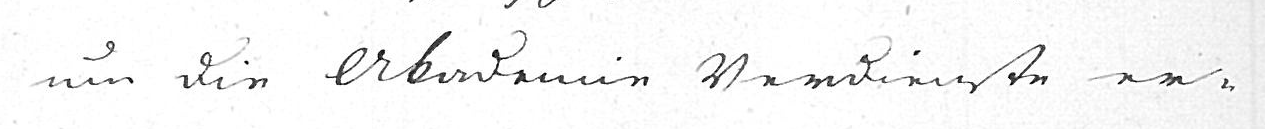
um die Akademie Verdienste er-
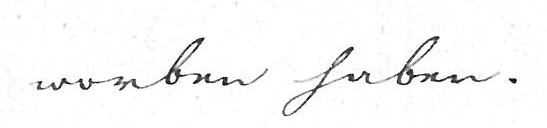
worben haben.
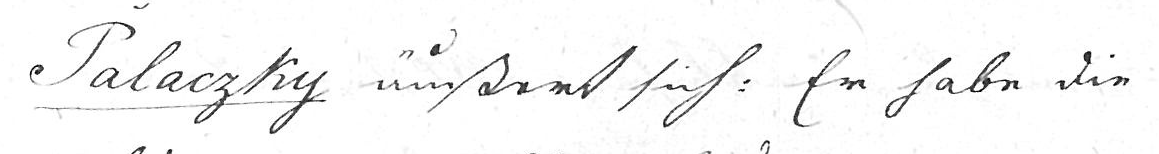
Palaczky äußert sich: Er habe die
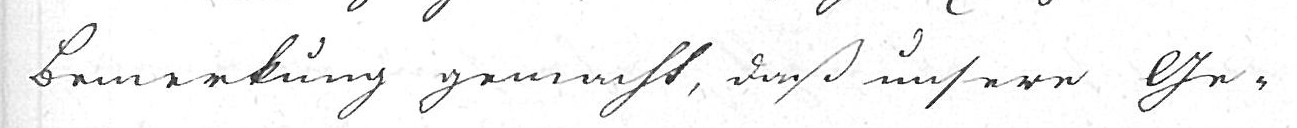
Bemerkung gemacht, daß unsere Ge-
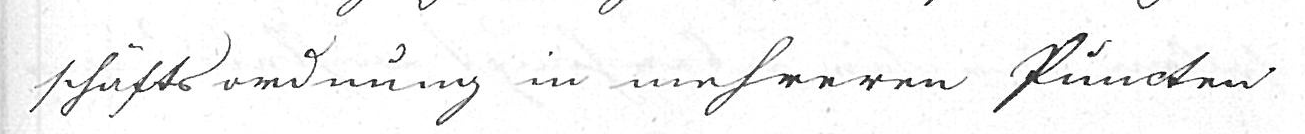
schäftsordnung in mehreren Puncten
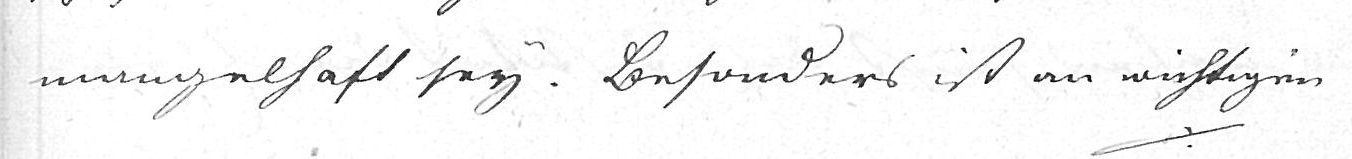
mangelhaft sey. Besonders ist an wichtigen
